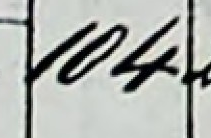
104
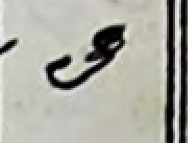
3
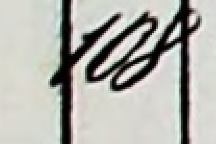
108
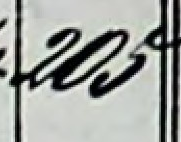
205
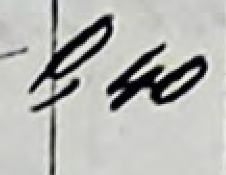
0,40
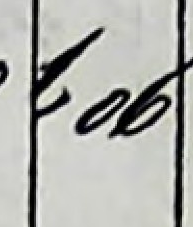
1,06
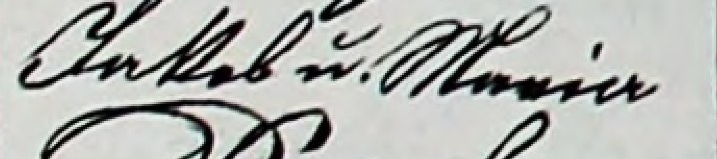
Jakob u. Maria
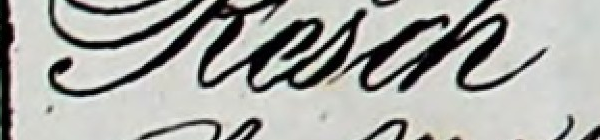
Resch
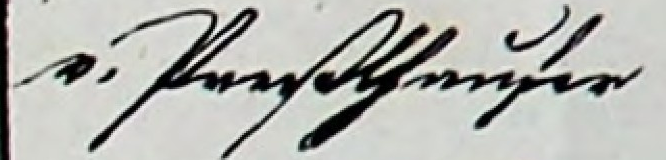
v. Preßthaufer
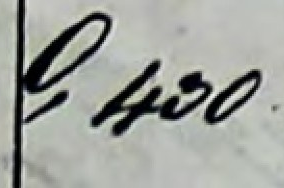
0,430
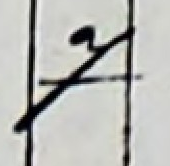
7
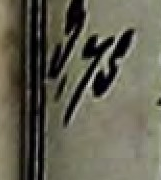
3,75
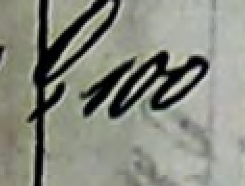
0,100
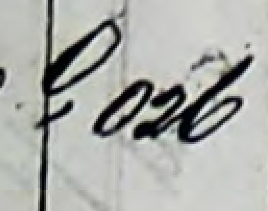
0,026
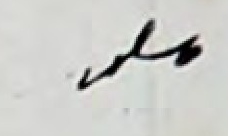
do
